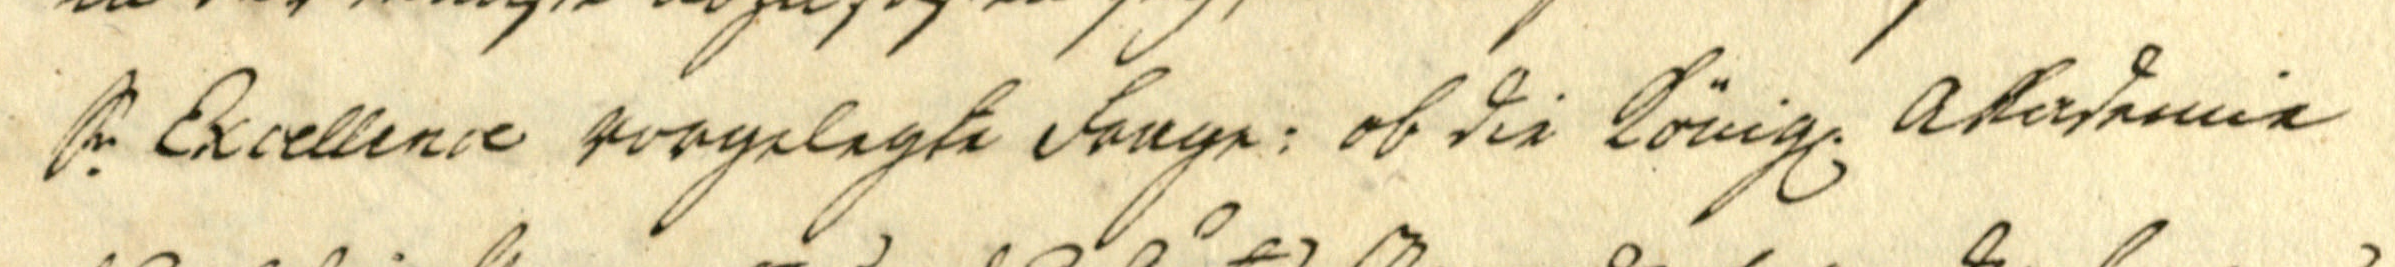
Sr. Excellence vorgelegte Frage: ob die Königl. Akademie
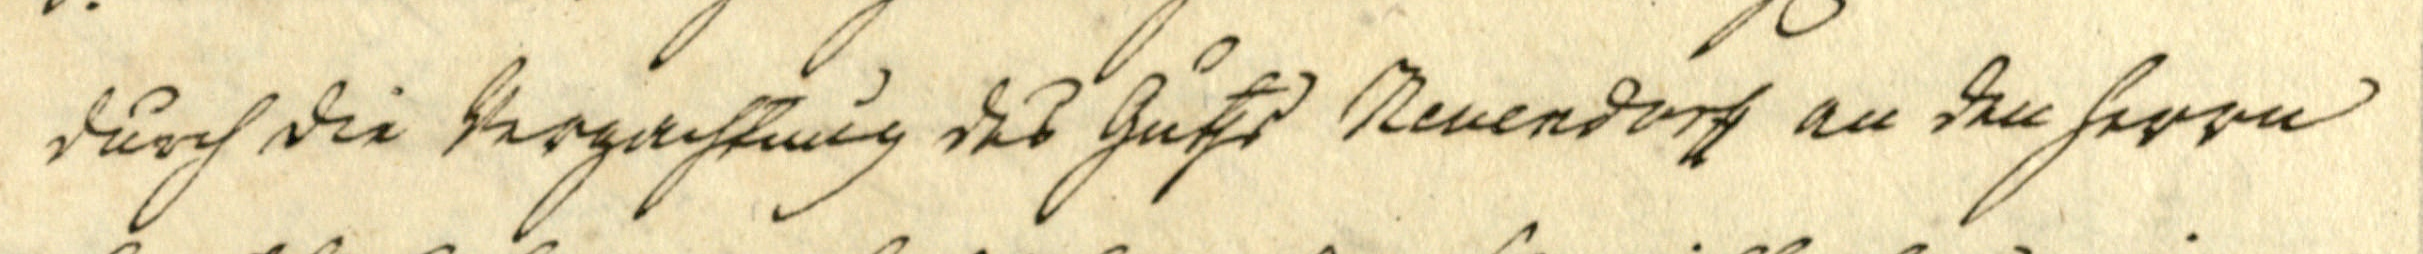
durch die Verpachtung des Guths Neuendorff an den Herrn
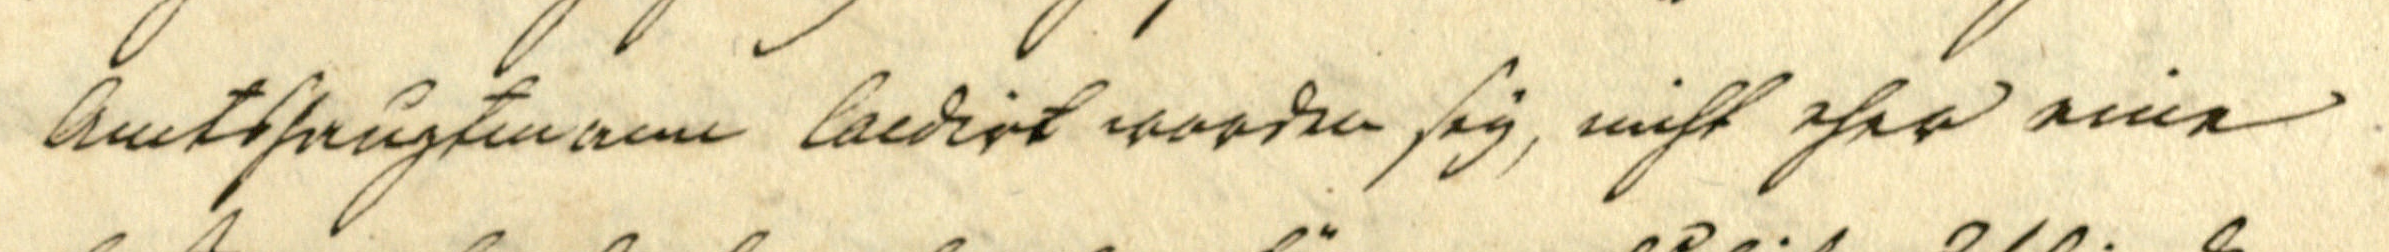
Amtshauptmann laedirt worden seÿ, nicht eher eine
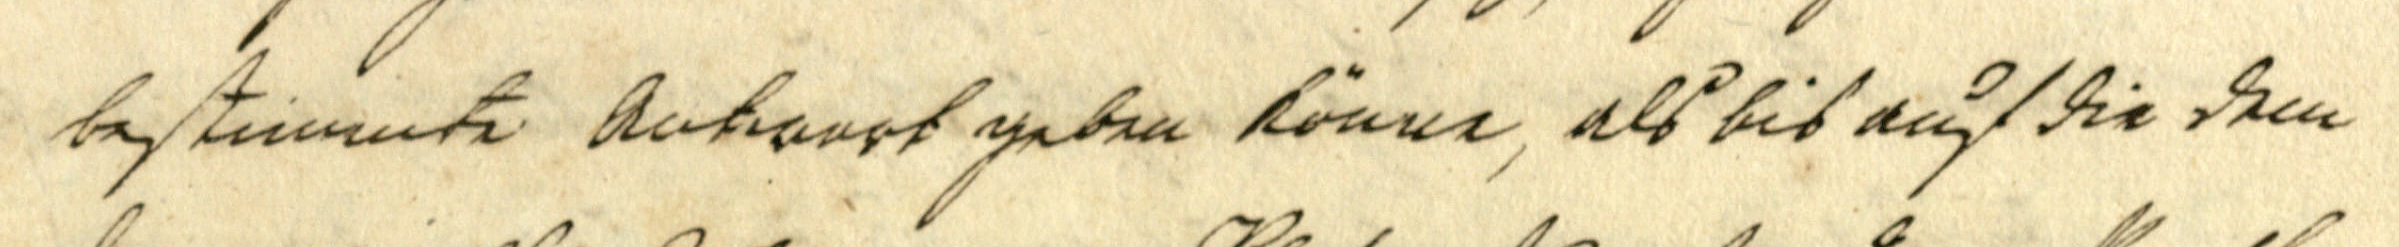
bestimmte Antwort geben könne, als bis auf die dem
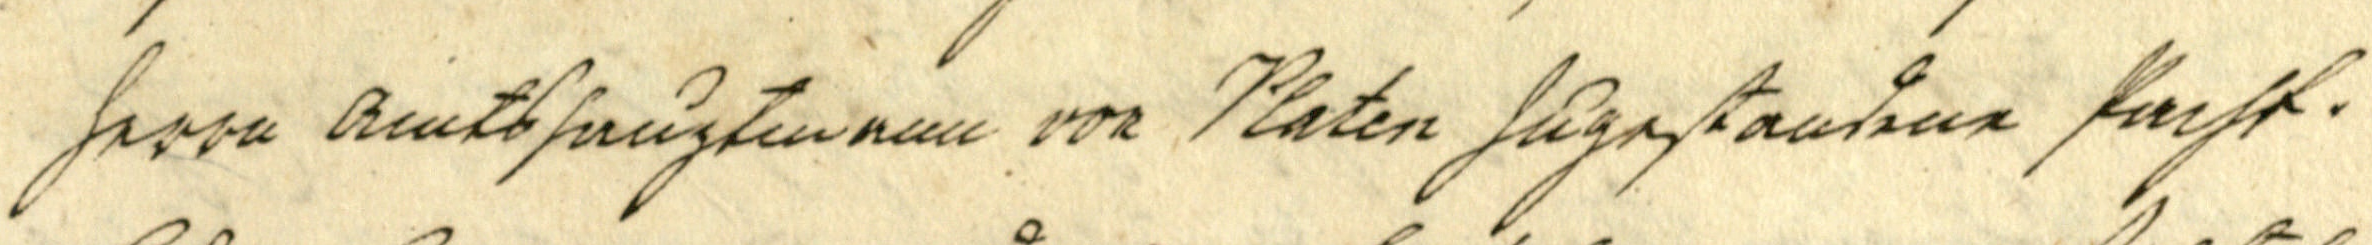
Herrn Amtshauptmann von Platen zugestandene Pacht¬
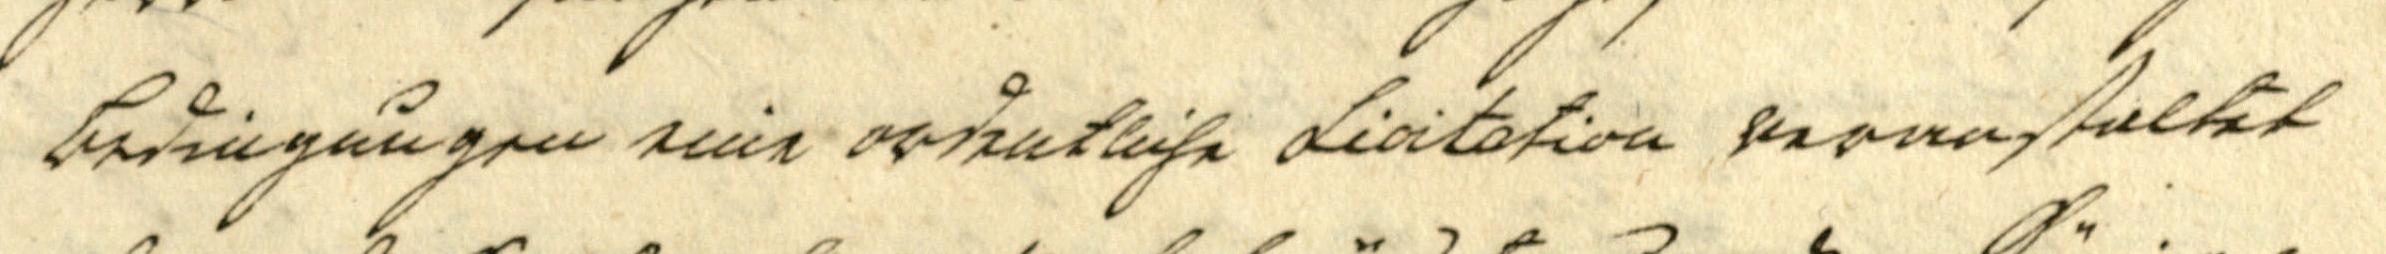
Bedingungen eine ordentliche Licitation veranstaltet
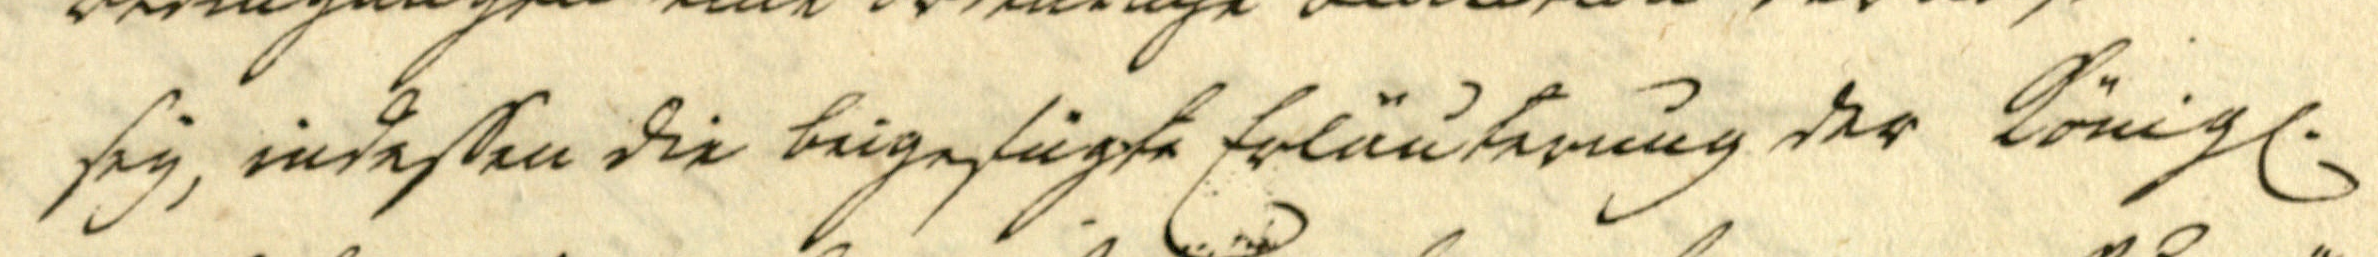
seÿ, indessen die beigefügte Erläuterung der Königl.
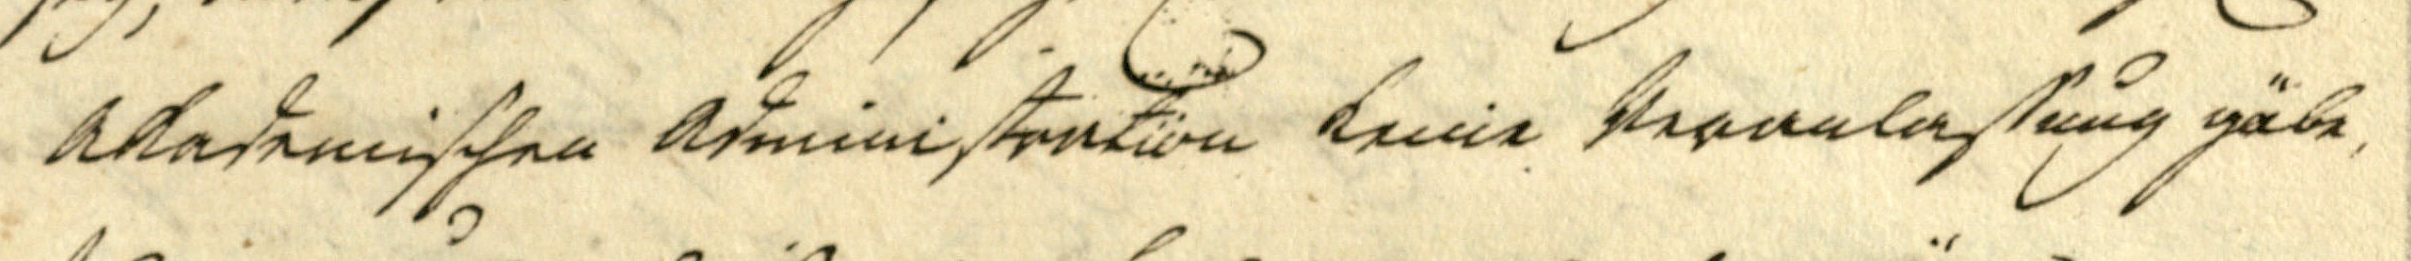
Akademischen Administration keine Veranlassung gäbe,
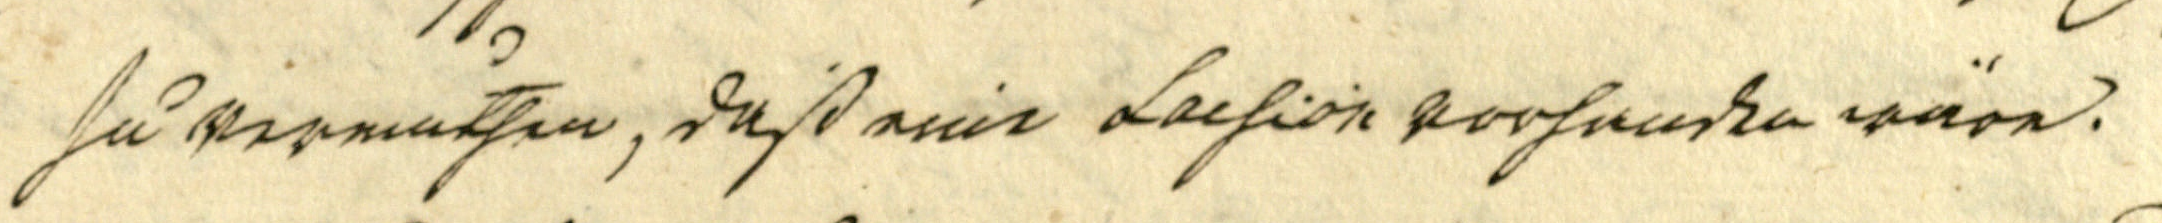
zu vermuthen, daß eine Laesion vorhanden wäre.
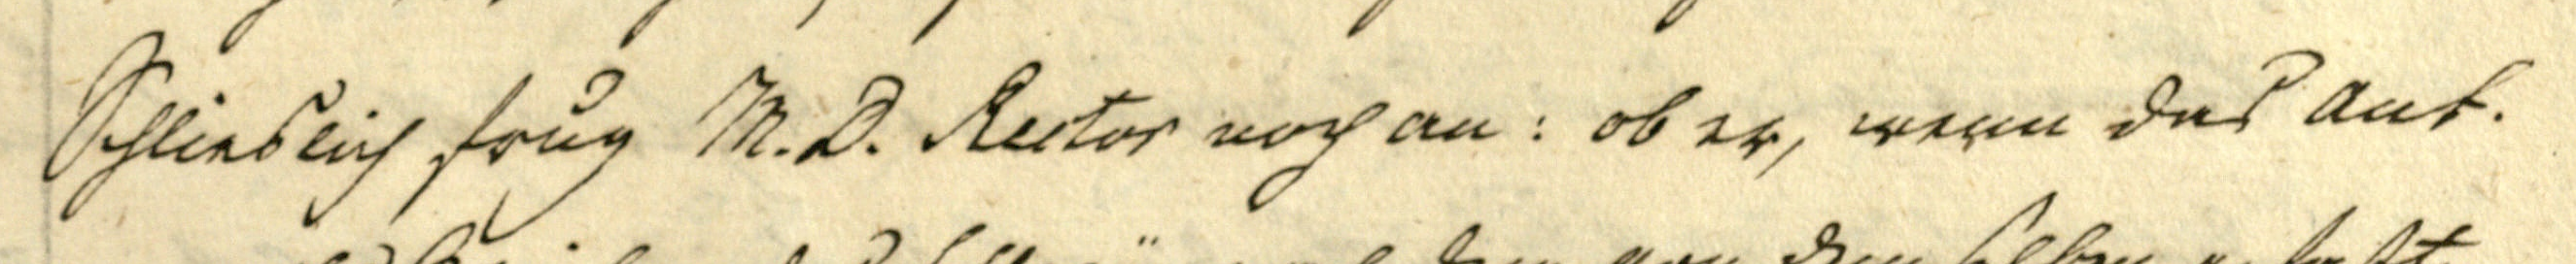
Schlieslich frug M. D. Rector noch an: ob er, wenn das Ant¬
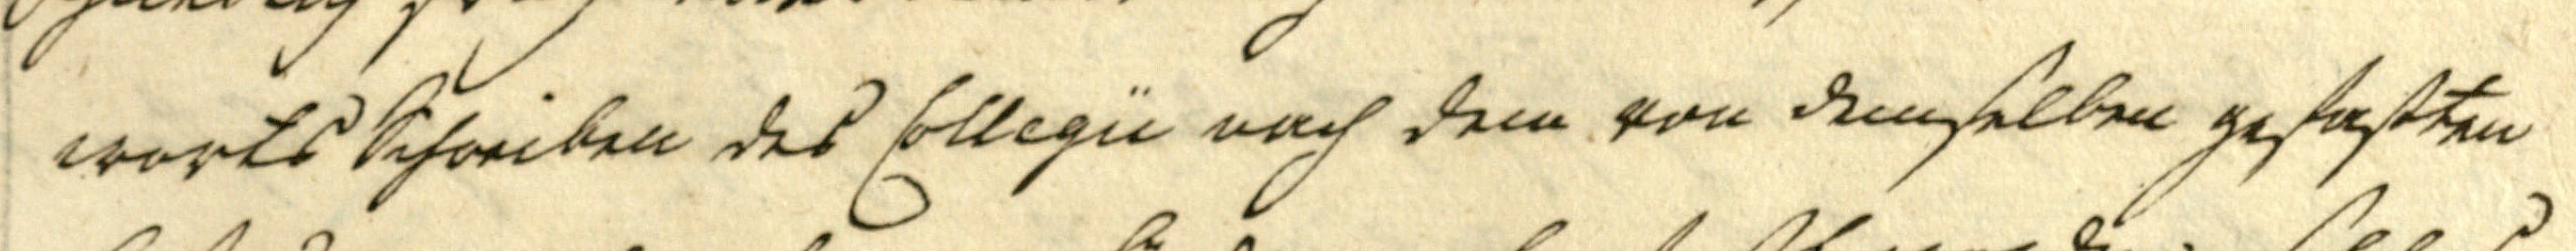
worts Schreiben des Collegii nach dem von demselben gefaßten
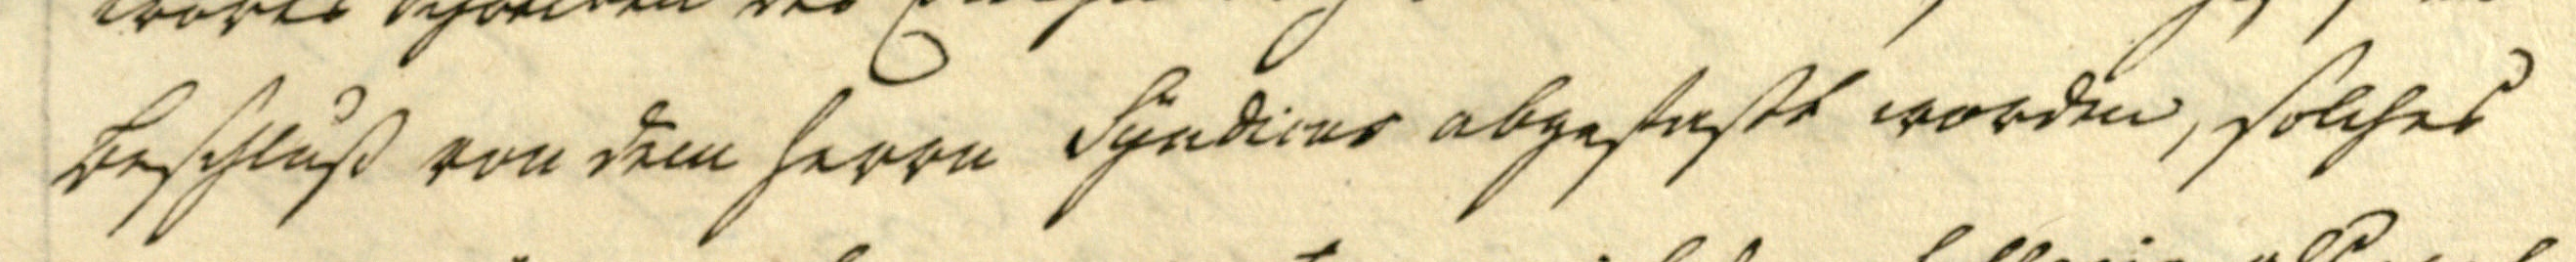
Beschluß von dem Herrn Sÿndicus abgefaßt worden, solches
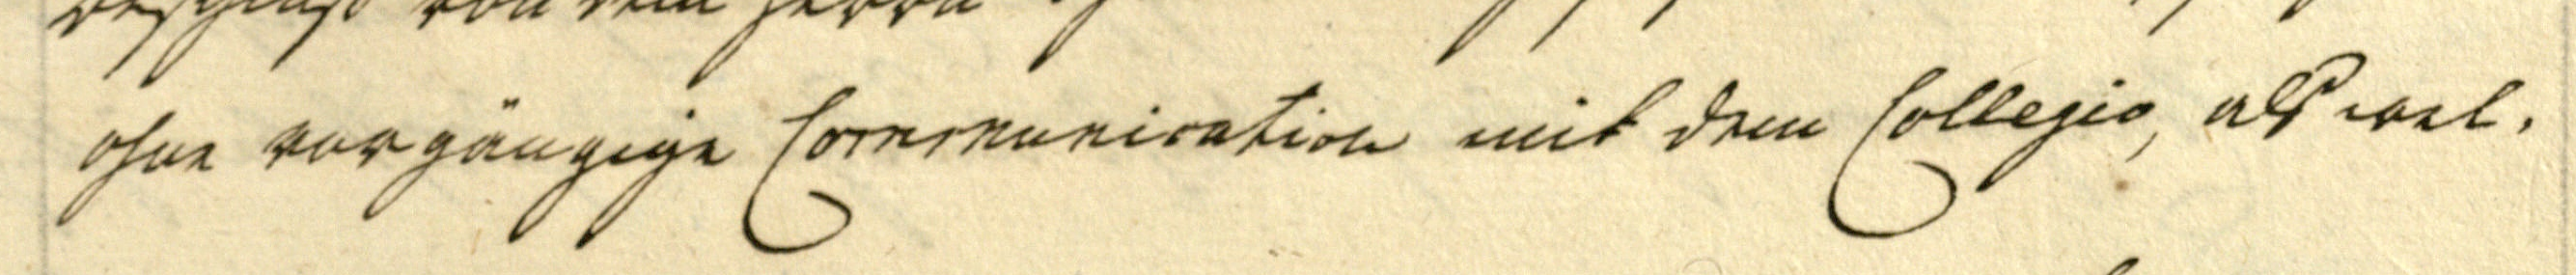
ohne vorgängige Communication mit dem Collegio, als wel¬
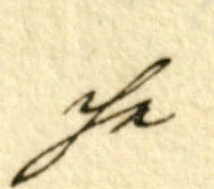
che
